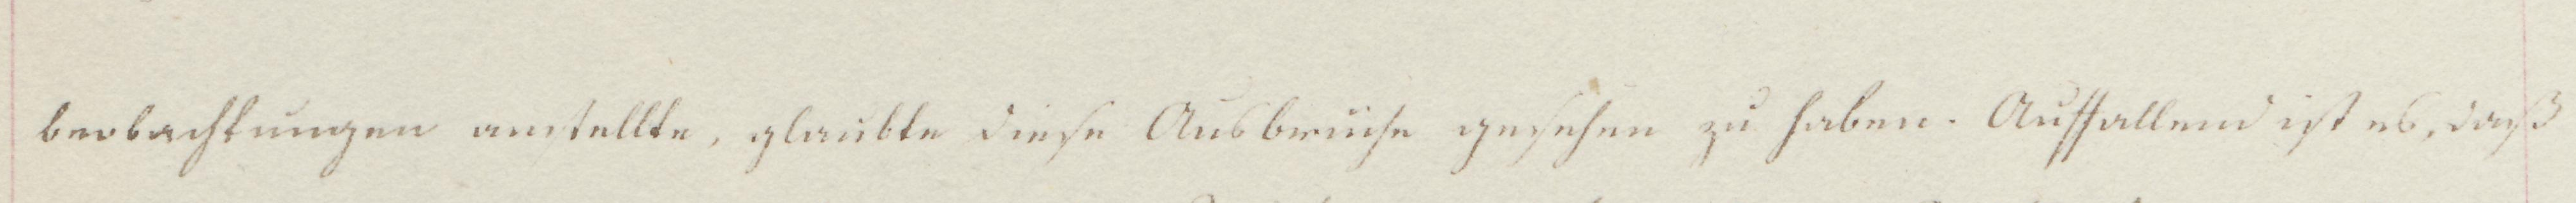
bachtungen anstellte, glaubte diese Ausbrüche gesehen zu haben. Auffallend ist es, daß
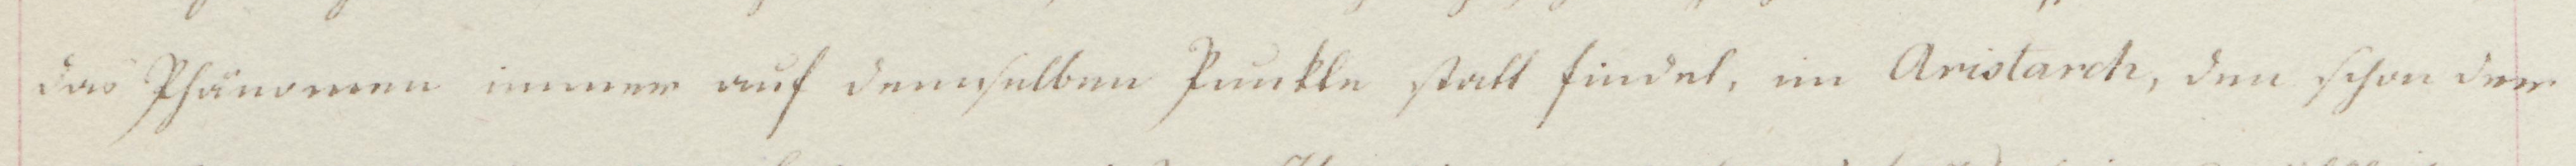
das Phänomen immer auf demselben Punkte statt findet, im Aristarch, den schon der
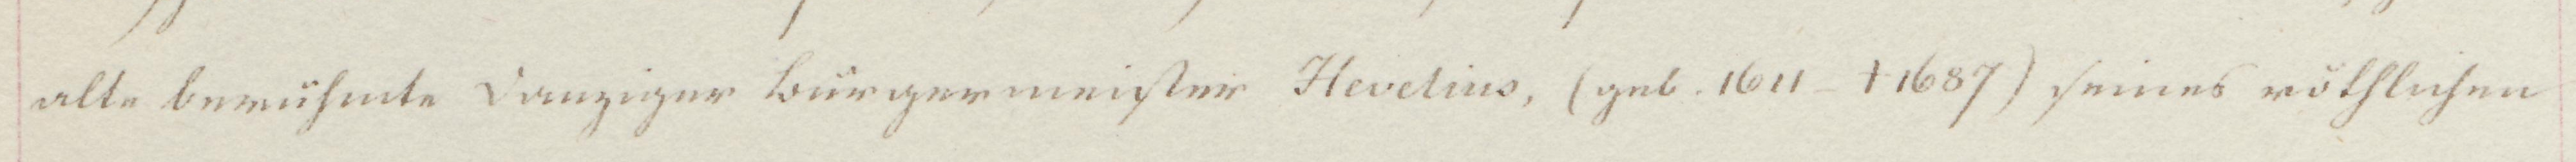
alte berühmte Danziger Bürgermeister Hevelius, seines röthlichen
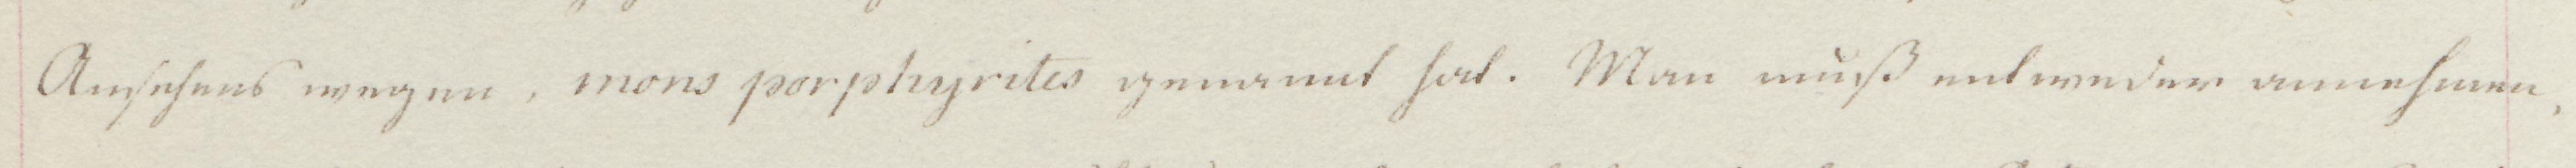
Ansehens wegen, mons porphyrites genannt hat. Man muß entweder annehmen,
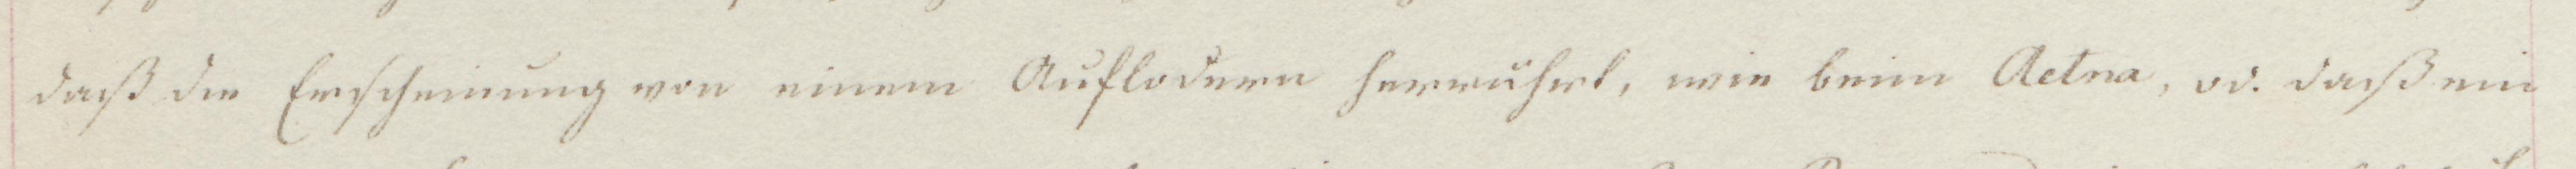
daß die Erscheinung von einem Auflodern herrührt, wie beim Aetna, od. daß ein
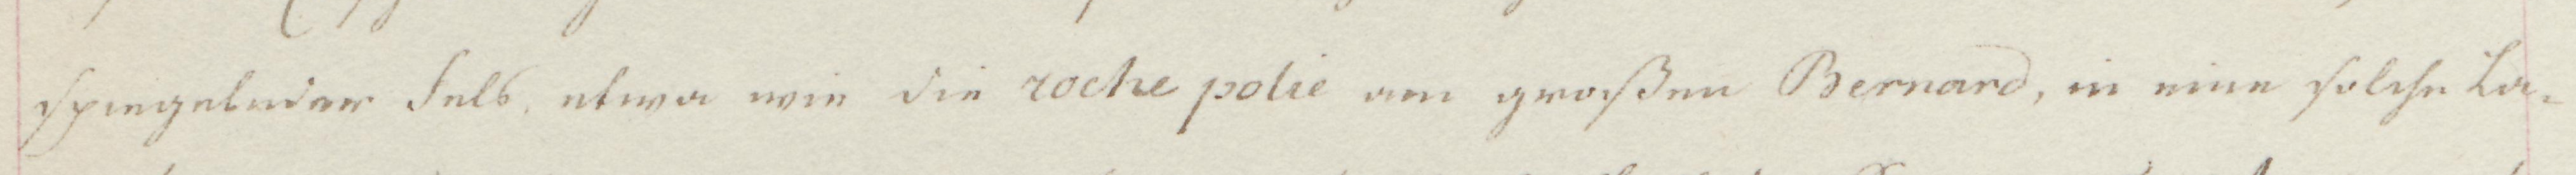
spiegelnder Fels, etwa wie die roche polie am großen Bernard, in eine solche La-
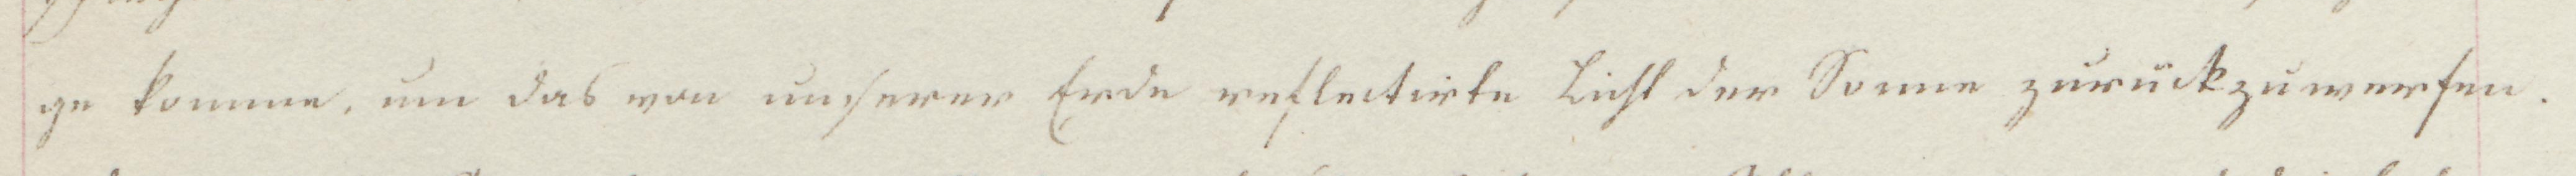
ge komme, um das von unserer Erde reflectirte Licht der Sonne zurückzuwerfen.
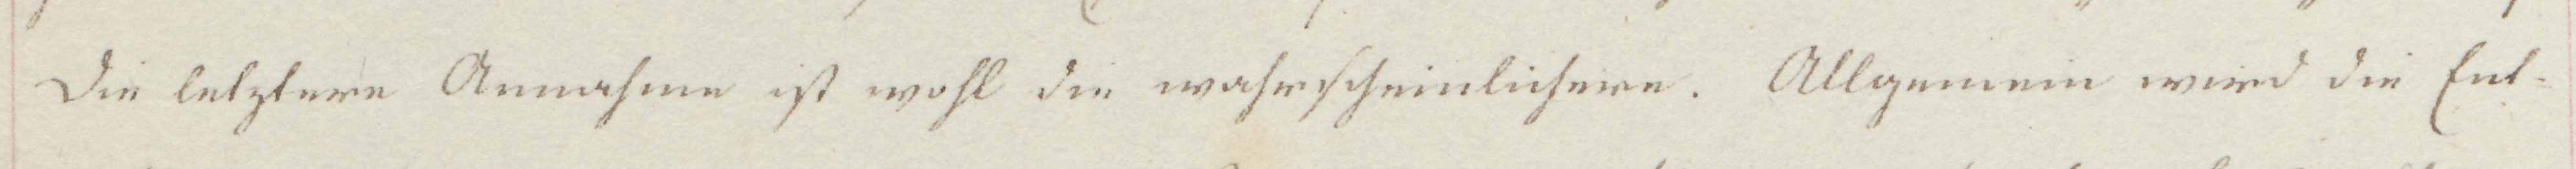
Die letztere Annahme ist wohl die wahrscheinlichere. Allgemein wird die Ent-
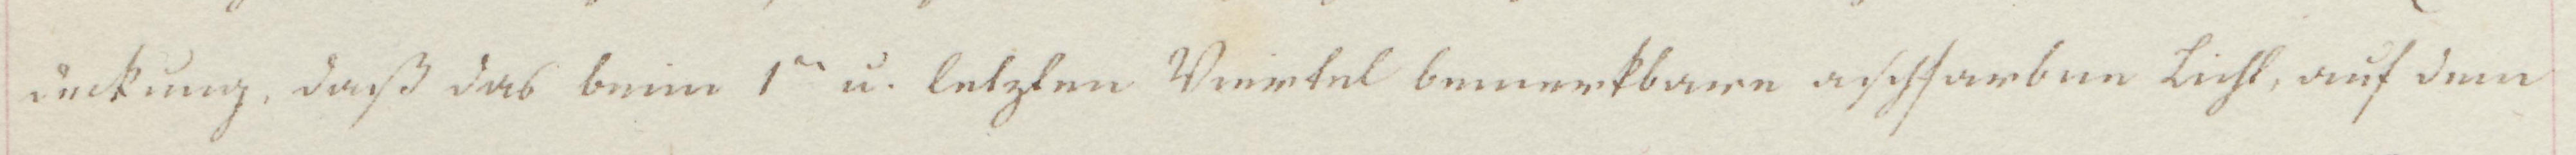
deckung, daß das beim 1t￼ u. letzten Viertel bemerkbare aschfarbne Licht, auf dem
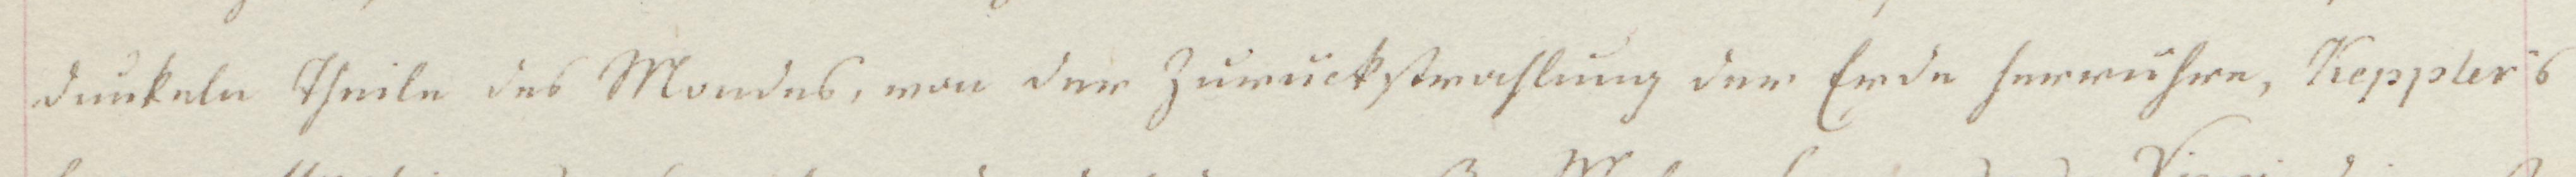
dunkeln Theile des Mondes, von der Zurückstrahlung der Erde herrühre, Keppler's
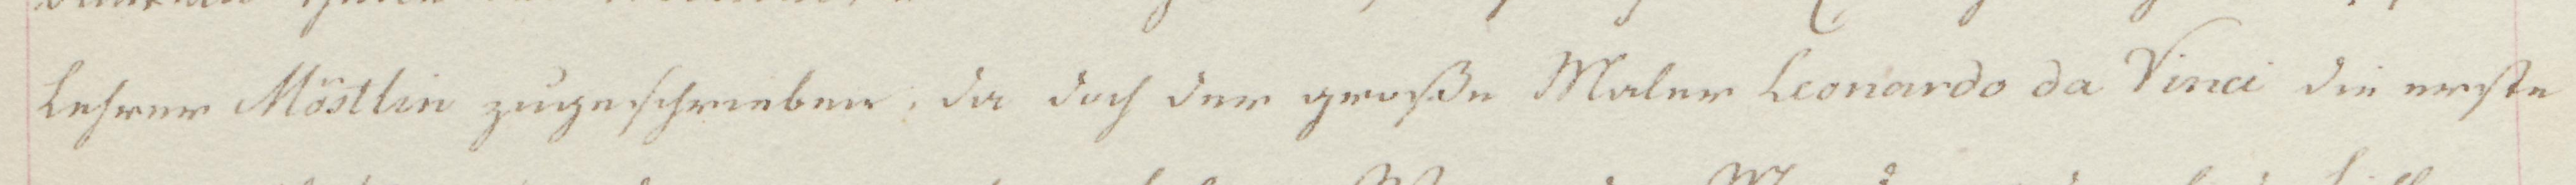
Lehrer Möstlin zugeschrieben, da doch der große Maler Leonardo da Vinci die erste
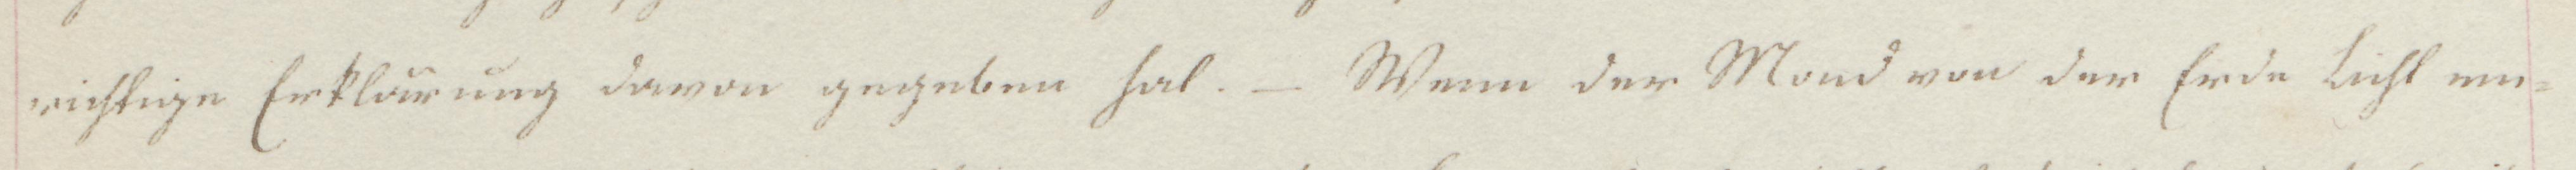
richtige Erklärung davon gegeben hat. – Wenn der Mond von der Erde Licht em-
